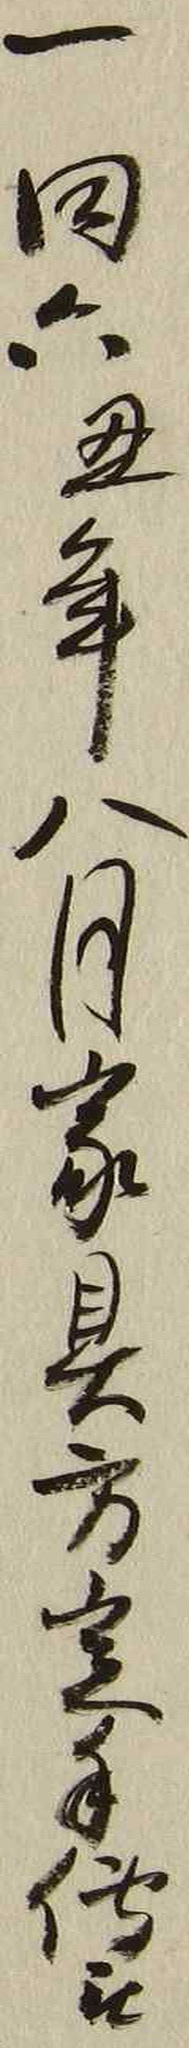一同六丑年八月家具方定手伝被
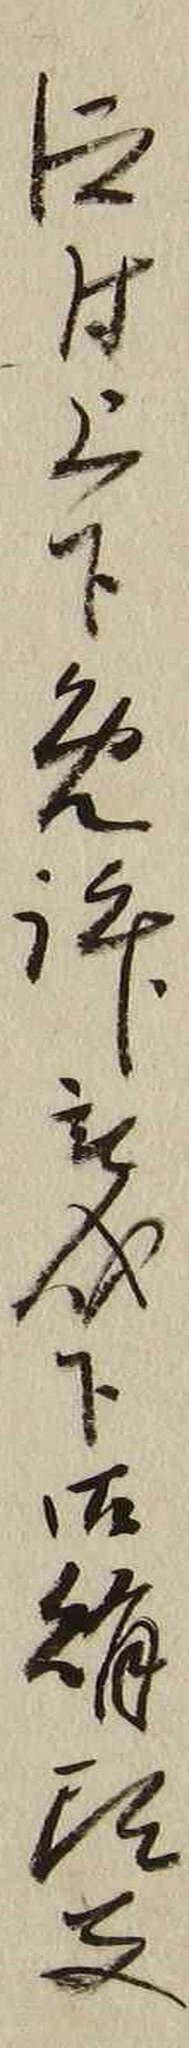仰付上下免許被成下御賄頭支
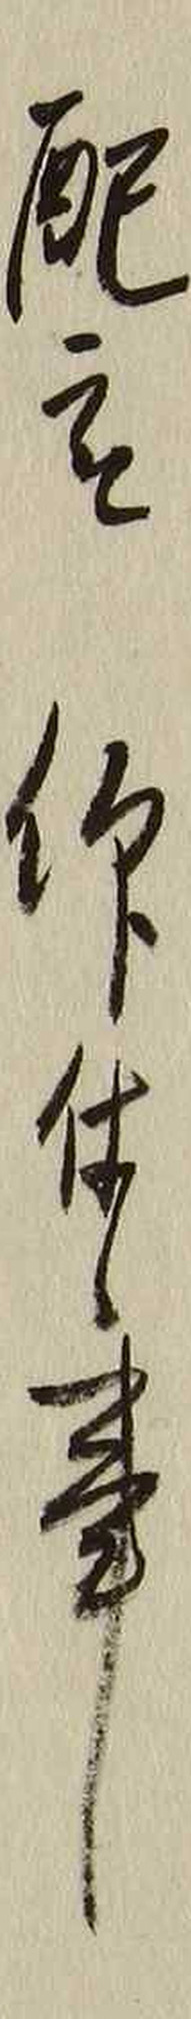配被仰付候事
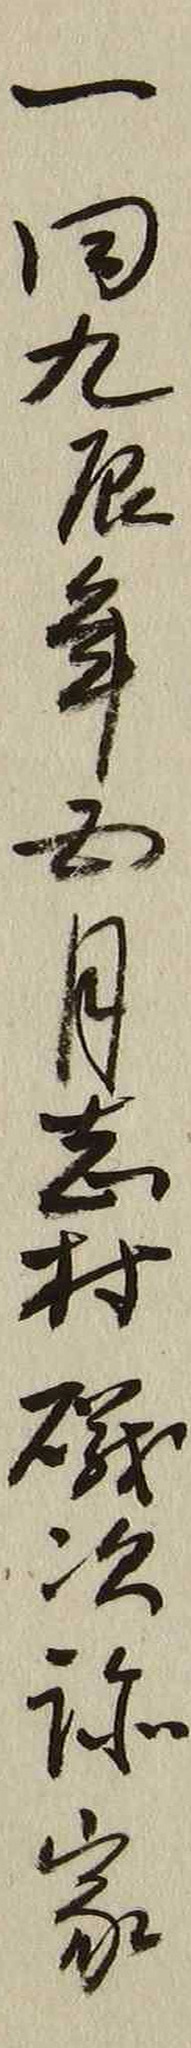一同九辰年五月志村磯次跡家
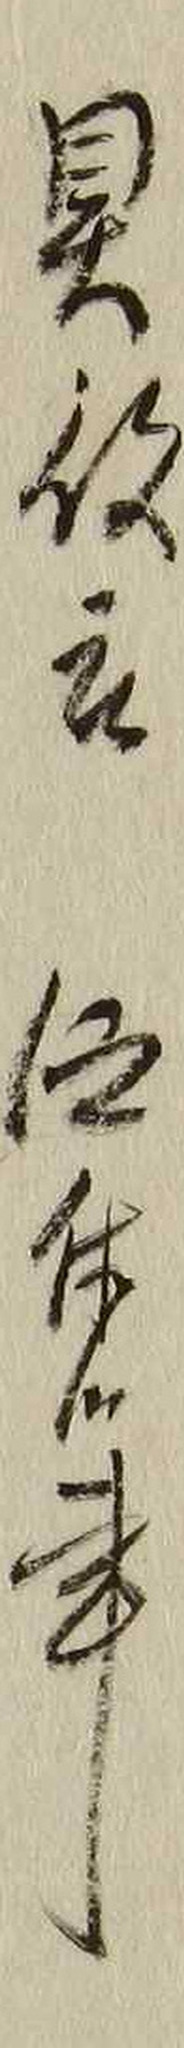具役被仰付候事
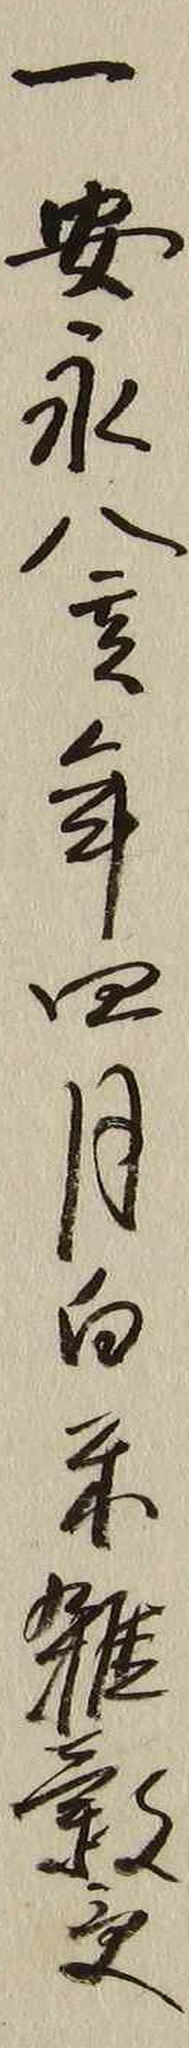一安永八亥年四月白米雑穀受
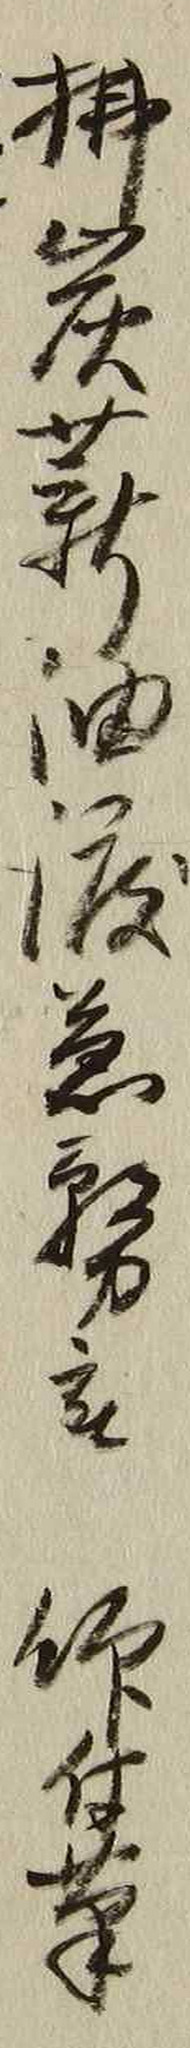払炭薪油渡兼務被仰付筆
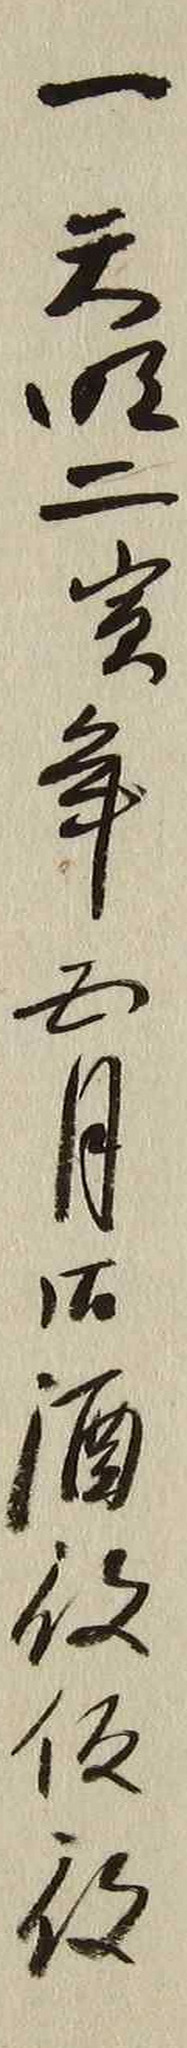一天明二寅年五月御酒役仮役
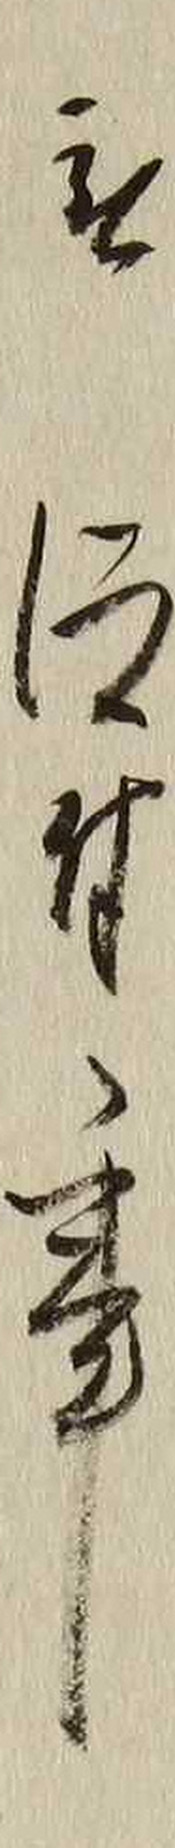被仰付候事
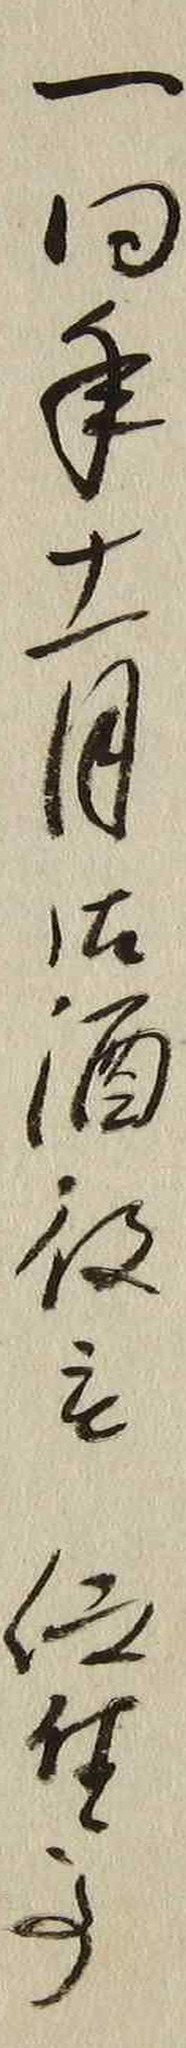一同年十一月御酒役被仰付候事
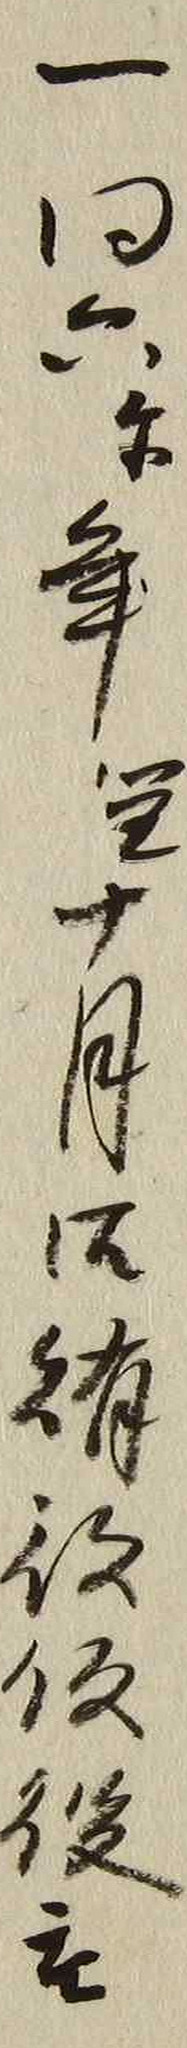一同六午年閏十月御賄役仮役被
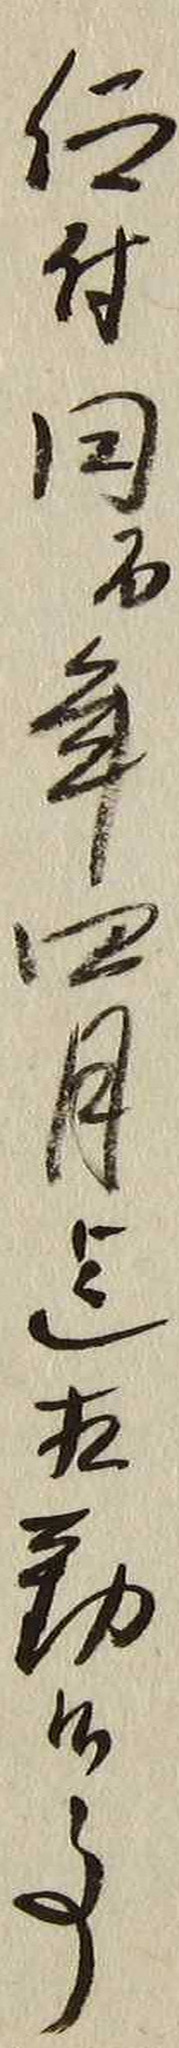仰付同酉年四月迄相勤候事
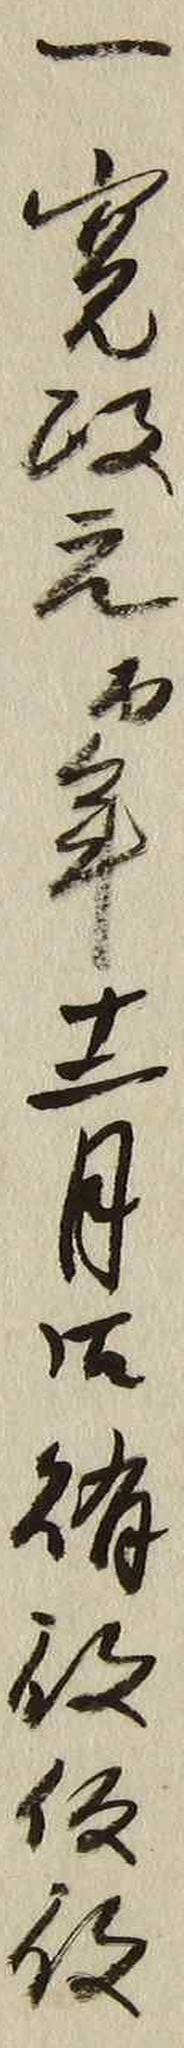一寛政元酉年十二月御賄役仮役
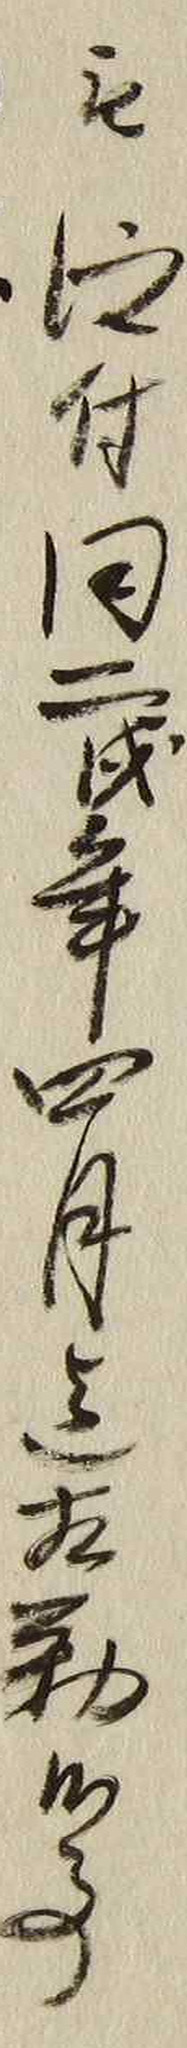被仰付同二戌年四月迄相勤候事
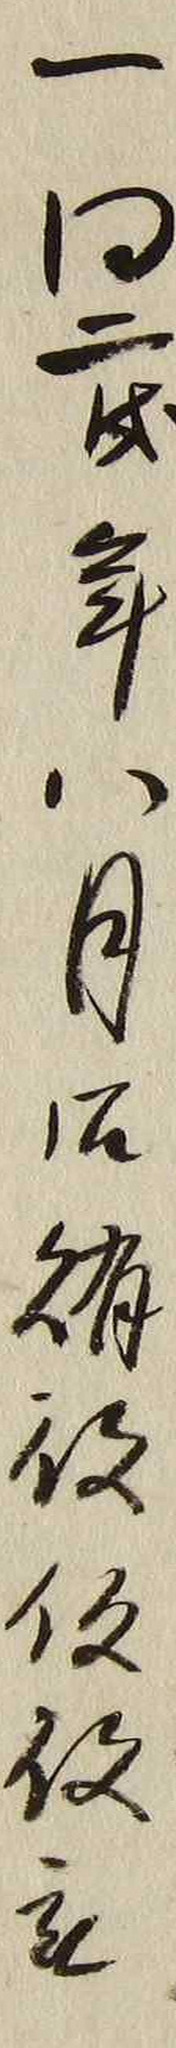一同二戌年八月御賄役仮役被
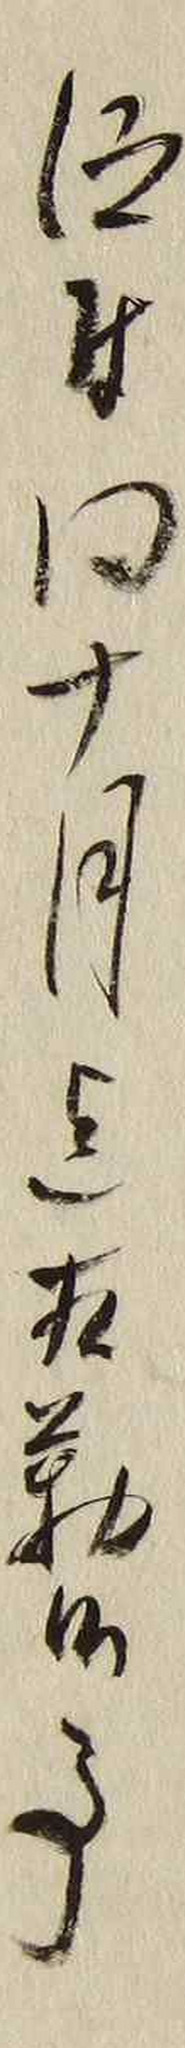仰付同十月迄相勤候事
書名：諸士系譜　巻之353　す之部3
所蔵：会津若松市立会津図書館
